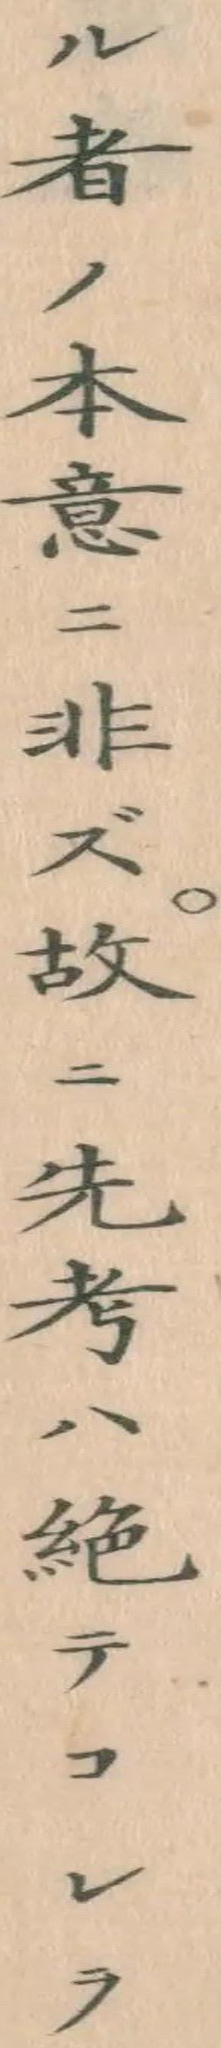ル者ノ本意ニ非ズ。故ニ先考ハ絶テコレヲ
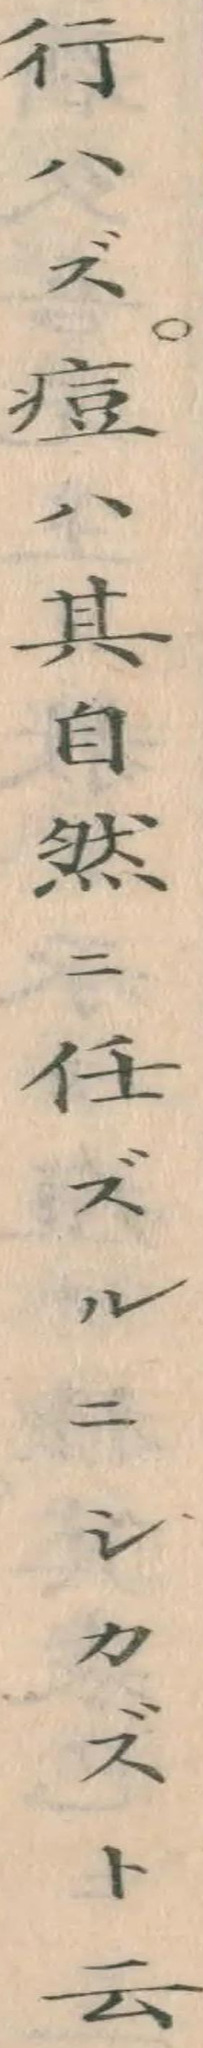行ハズ。痘ハ其自然ニ任ズルニシカズト云
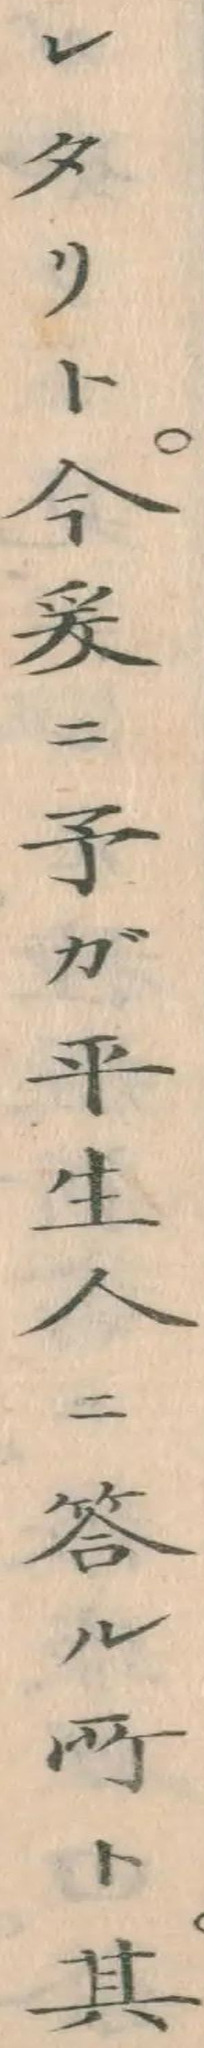レタリト。今爰ニ予ガ平生人ニ答ル所ト。其
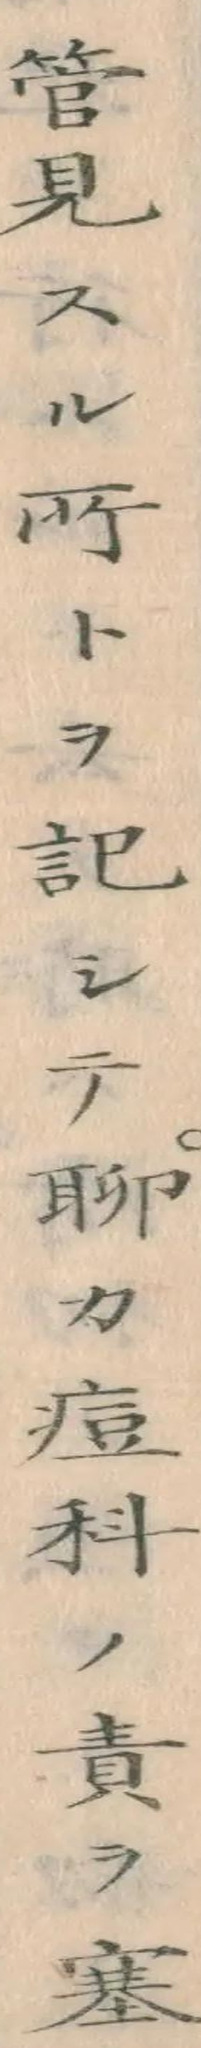管見スル所トヲ記シテ。聊カ痘科ノ責ヲ塞
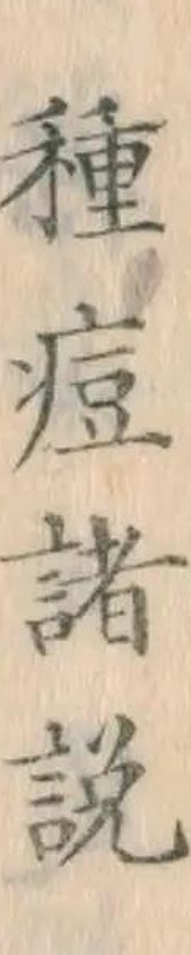種痘諸説
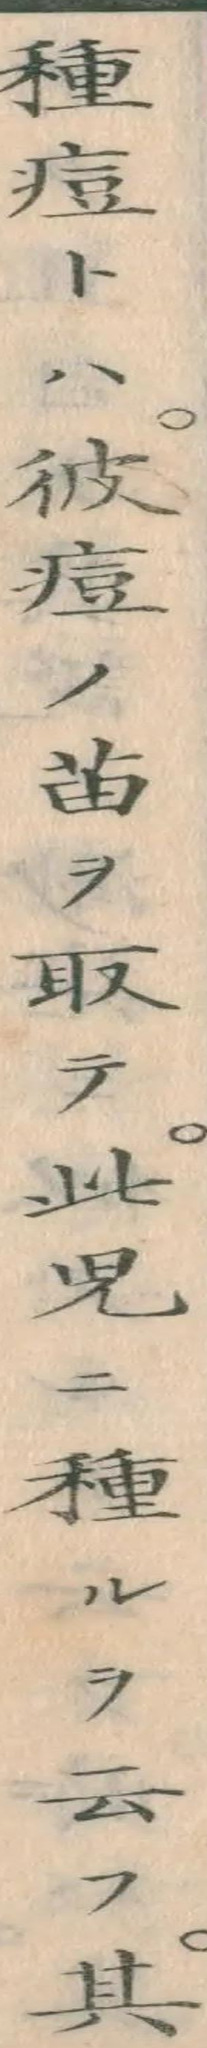種痘トハ。彼痘ノ苗ヲ取テ。此児ニ種ルヲ云フ。其
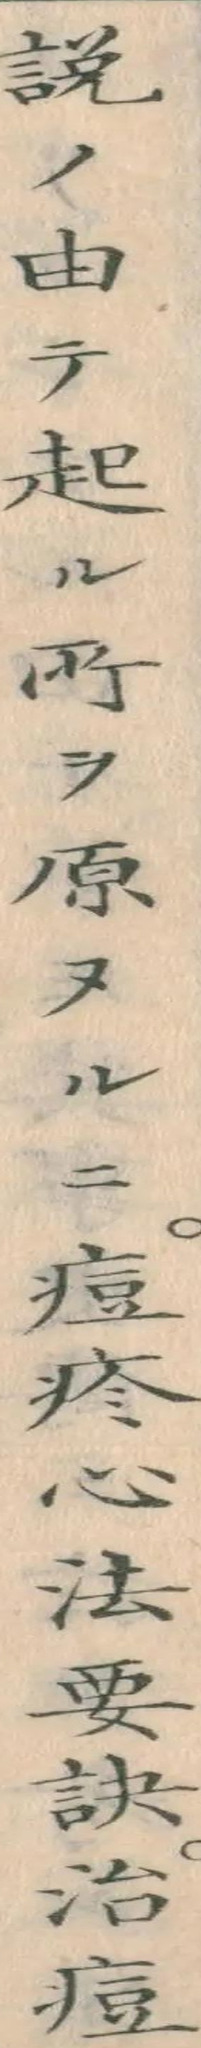説ノ由テ起ル所ヲ原ヌルニ。痘疹心法要訣。治痘
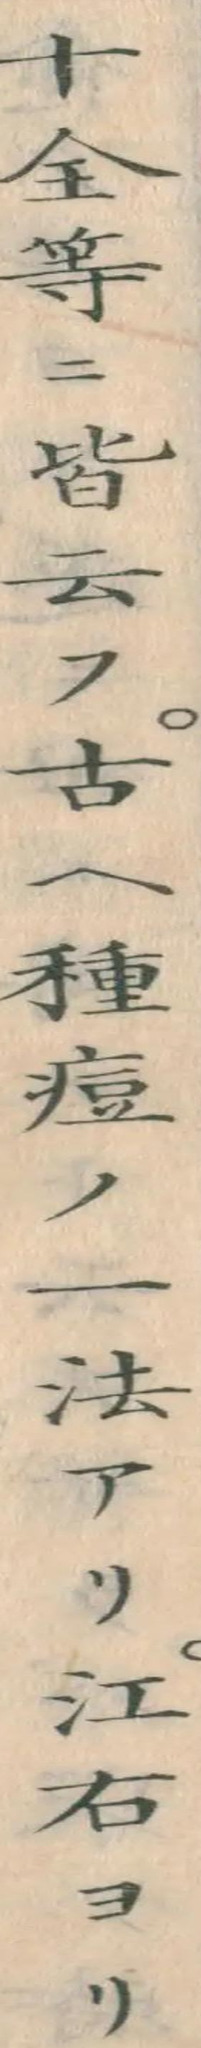十全等ニ皆云フ。古ヘ種痘ノ一法アリ。江右ヨリ
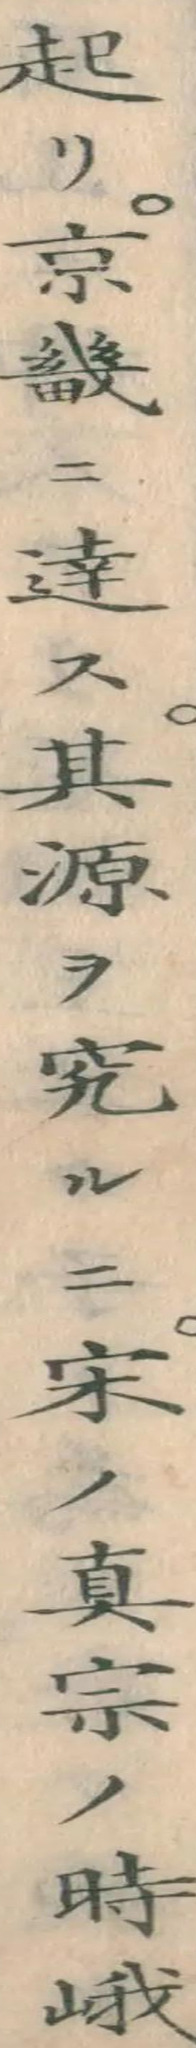起リ。京畿ニ達ス。其源ヲ究ルニ。宋ノ真宗ノ時。峨

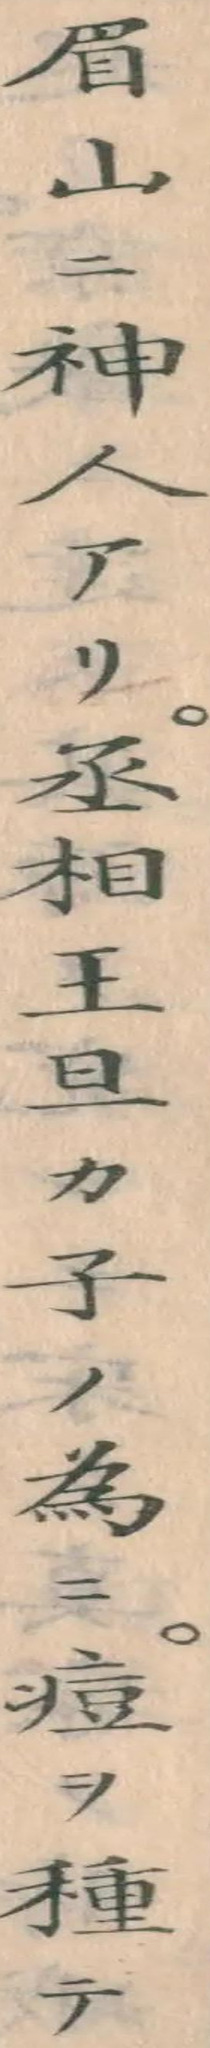眉山ニ神人アリ。丞相王旦カ子ノ為ニ。痘ヲ種テ
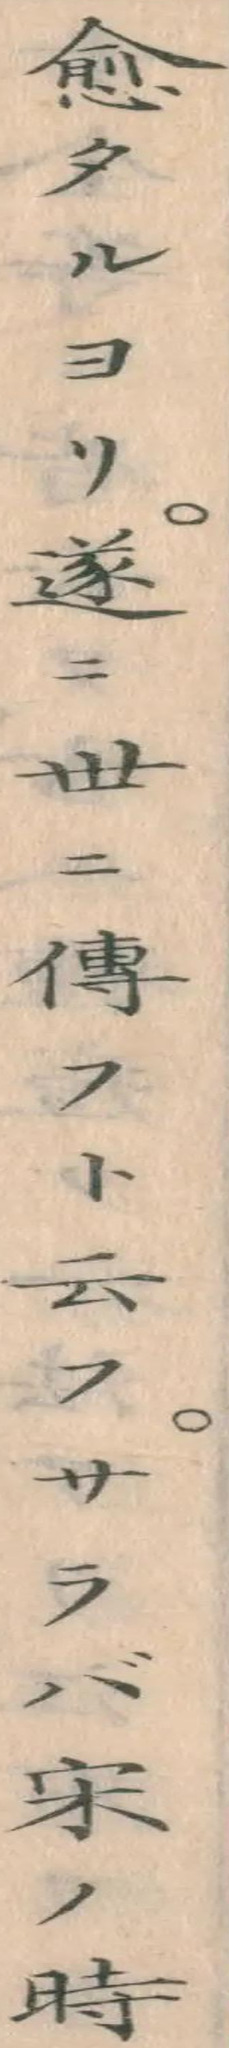愈タルヨリ。遂ニ世ニ伝フト云フ。サラバ宋ノ時
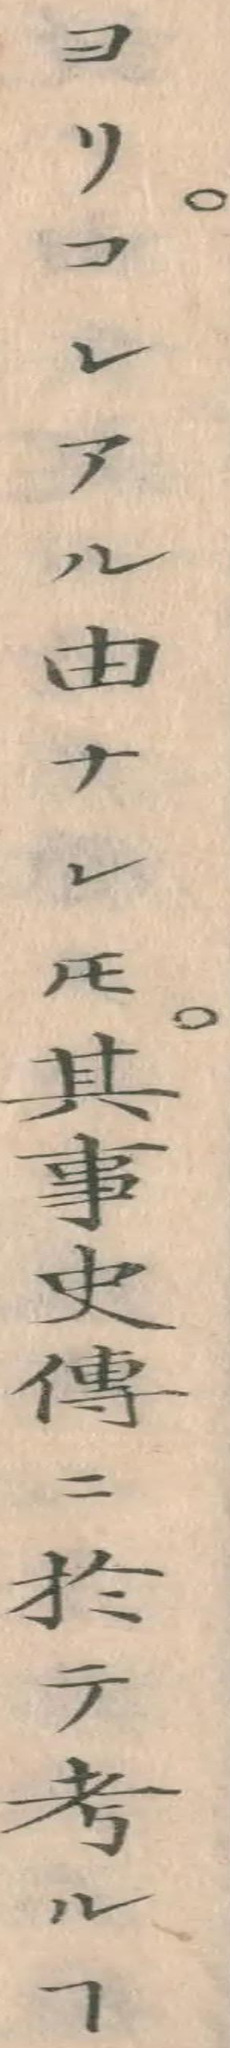ヨリ。コレアル由ナレ𪜈。其事史伝ニ於テ考ルヿ
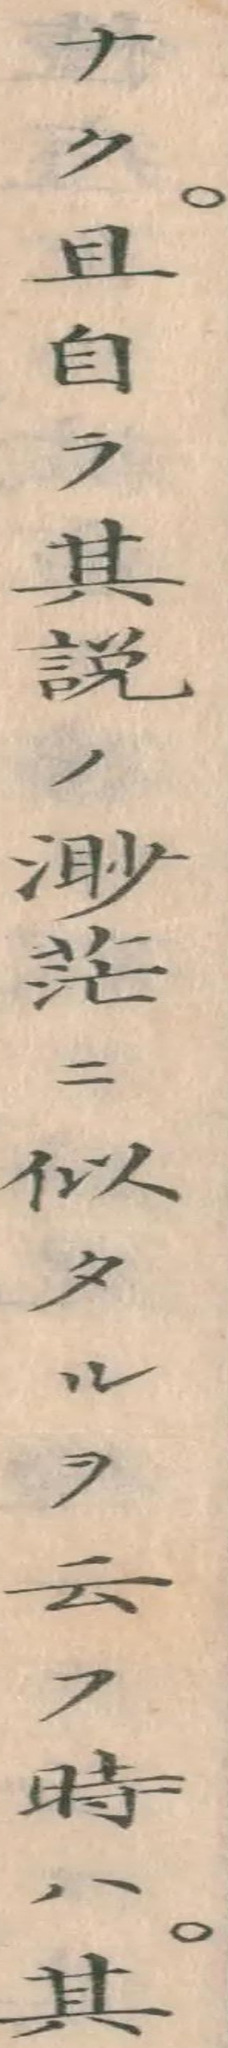ナク。且自ラ其説ノ渺茫ニ似タルヲ云フ時ハ。其
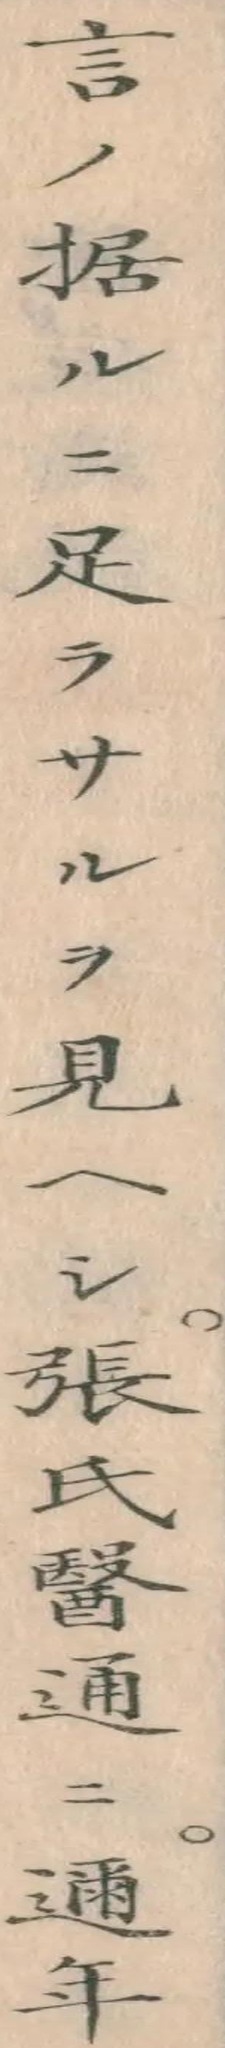言ノ据ルニ足ラサルヲ見ヘシ。張氏医通ニ。邇年
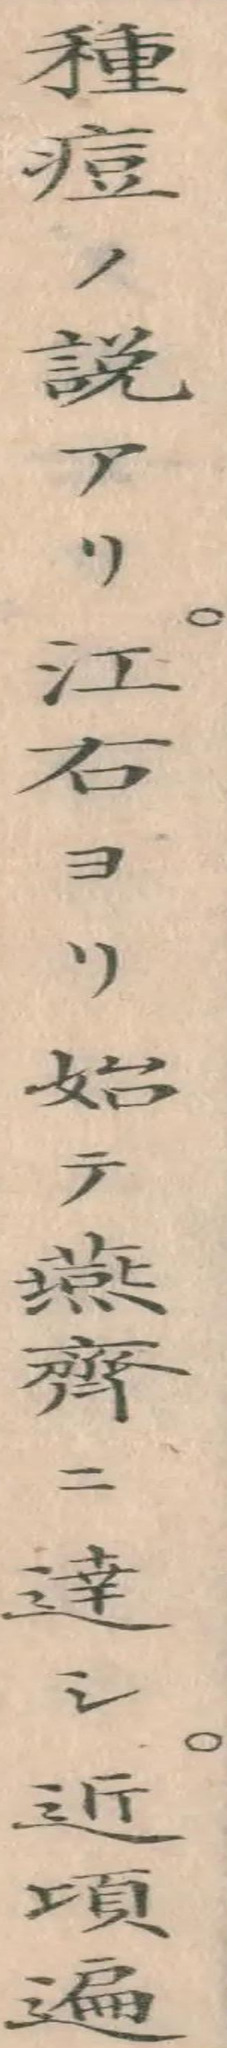種痘ノ説アリ。江右ヨリ始テ燕斉ニ達シ。近頃遍
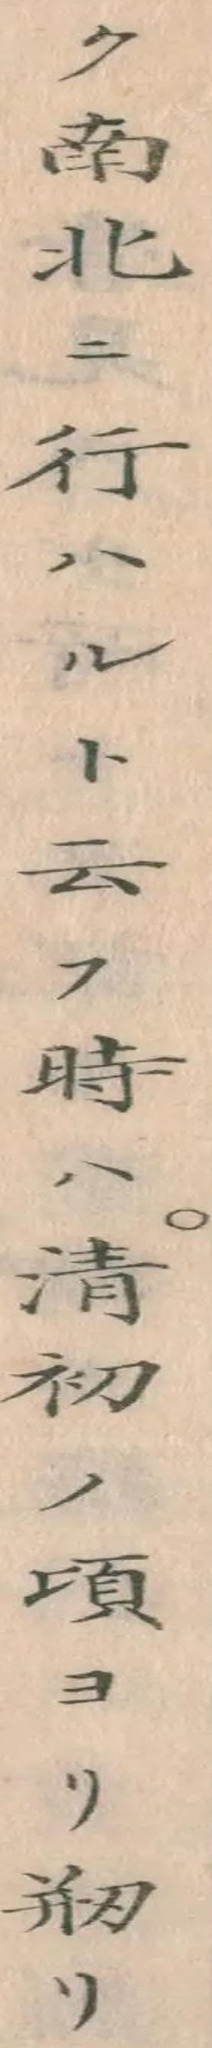ク南北ニ行ハルト云フ時ハ。清初ノ頃ヨリ剏リ
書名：種痘弁義
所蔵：国立国会図書館 National Diet Library, JAPAN
